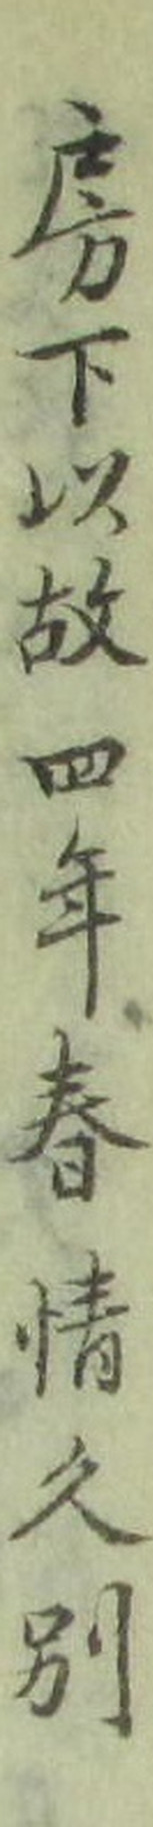房下以故四年春情久別王
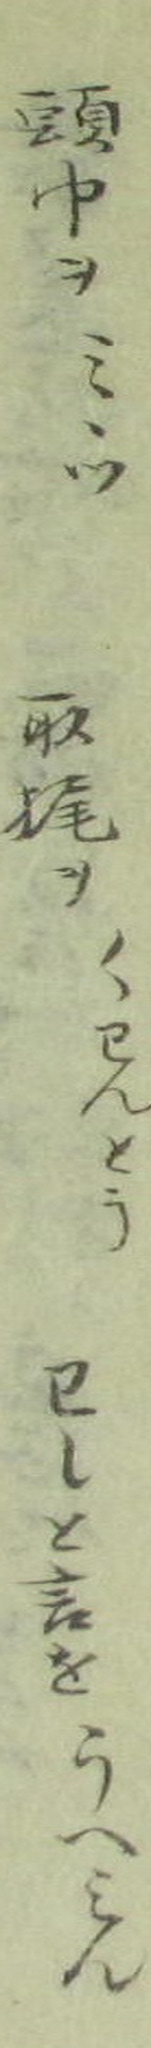頭巾ヲミヽツ取梶ヲくわんとうわしと言をうへみん
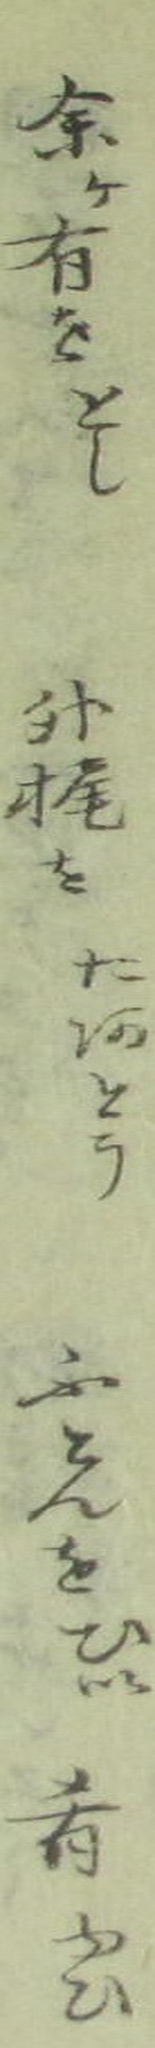余ヶ有をとし外梶をたあとうふとんをひい肴ふひ
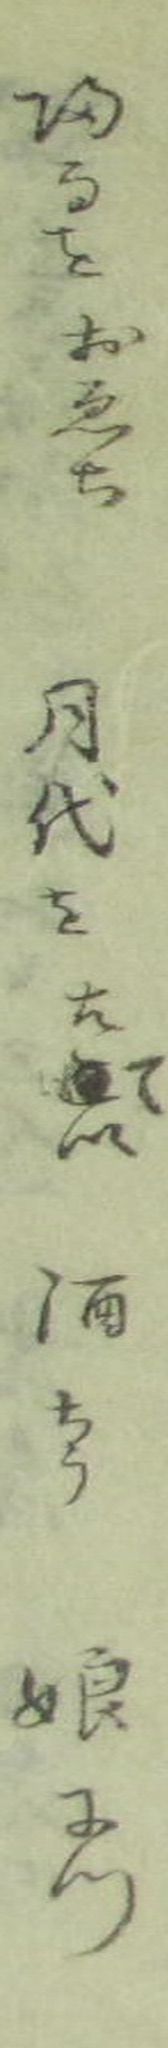帰るをおゑち月代をてい酒ちう娘につ
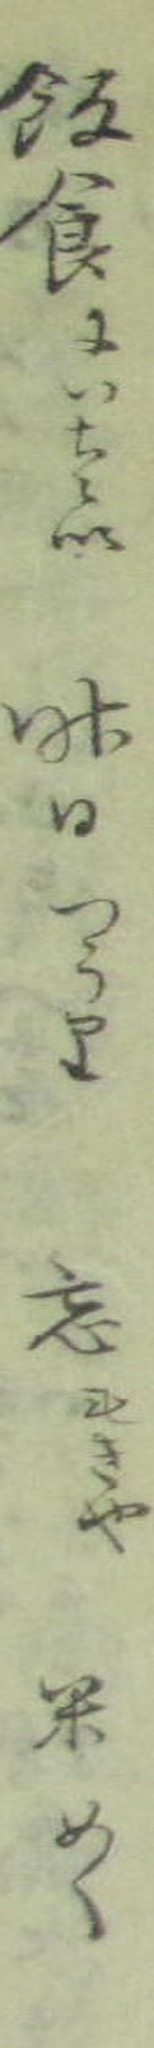飯食にいち々い昨日つうり忘もきや米めく

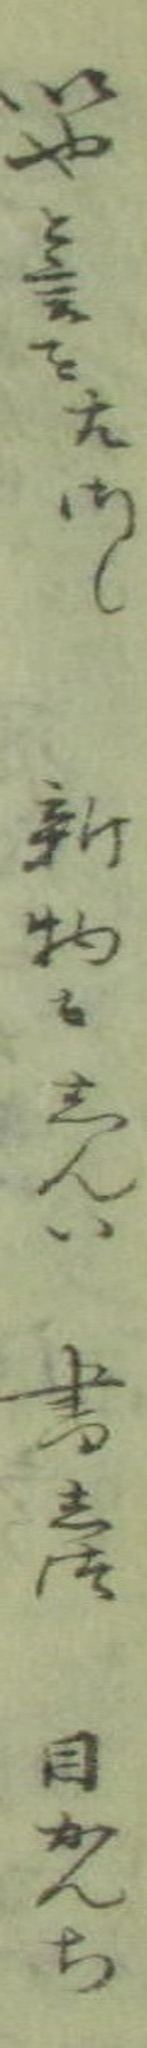いやと言をはし新物をしんい書しつ目かんち
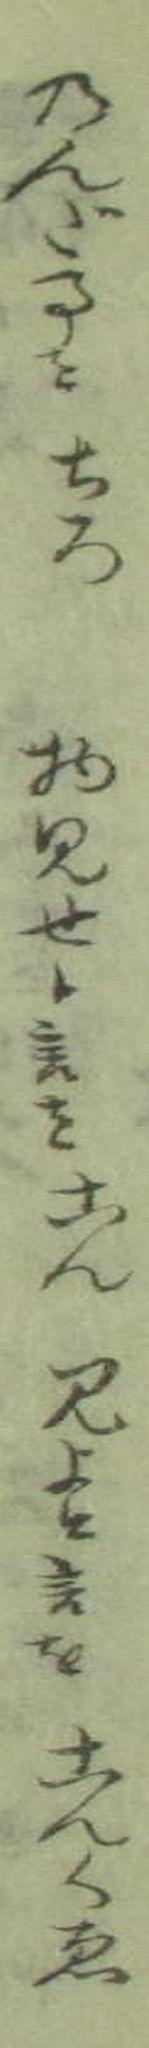のんだ事をちろ物見せト言をこん見よと言をこんくゑ
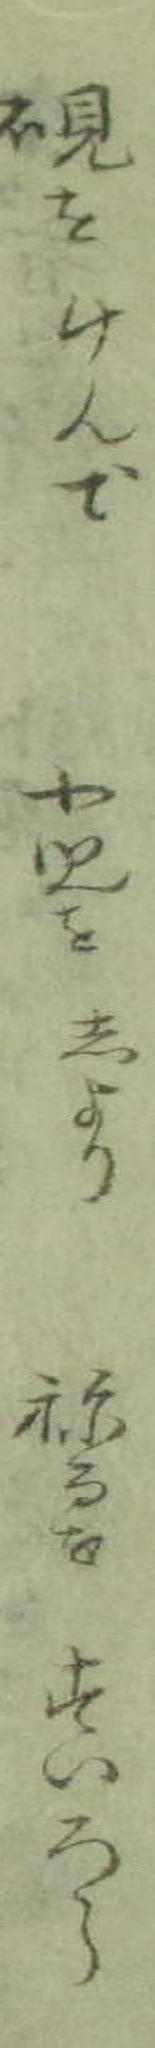硯をけんで小児をしよりねるをすいろう
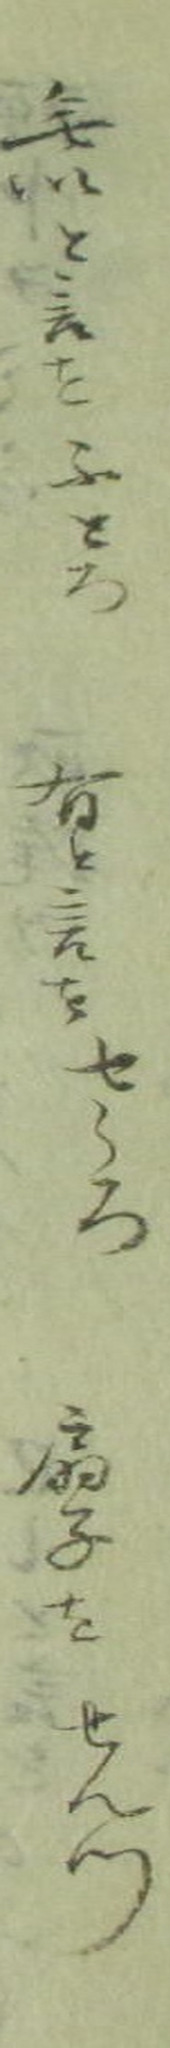無いと言をふとろ有と言をせうろ扇子をせんつ
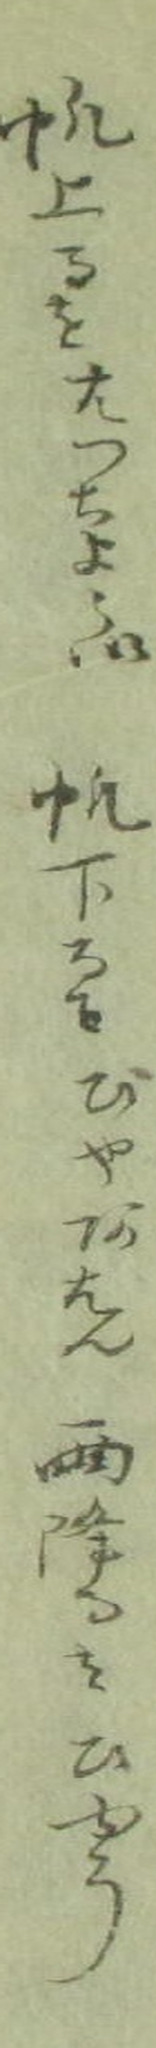帆上るをはつちようい帆下るをびやあはん雨降るをひやう
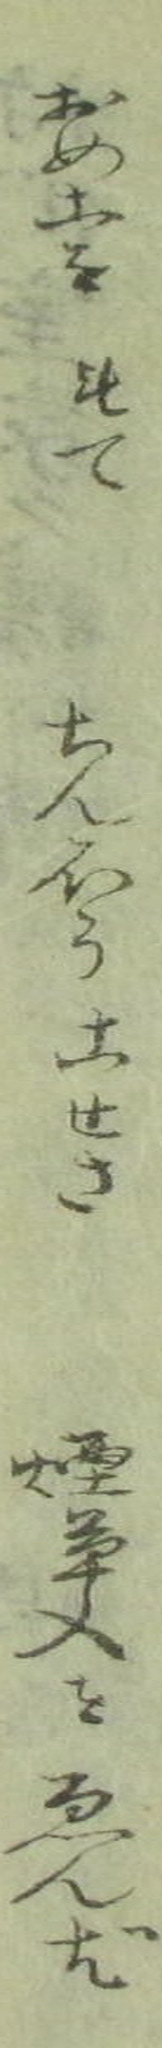おめこをもてちんほうこせさ煙草入をゑんば
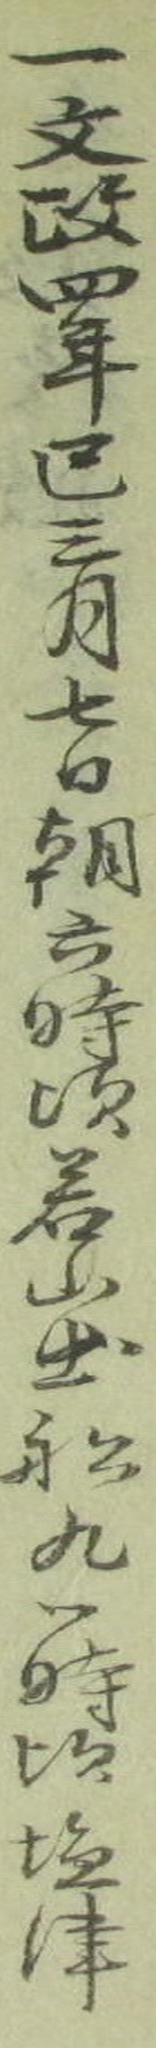一文政四年巳三月七日朝六時頃若山出船九ツ時頃塩津
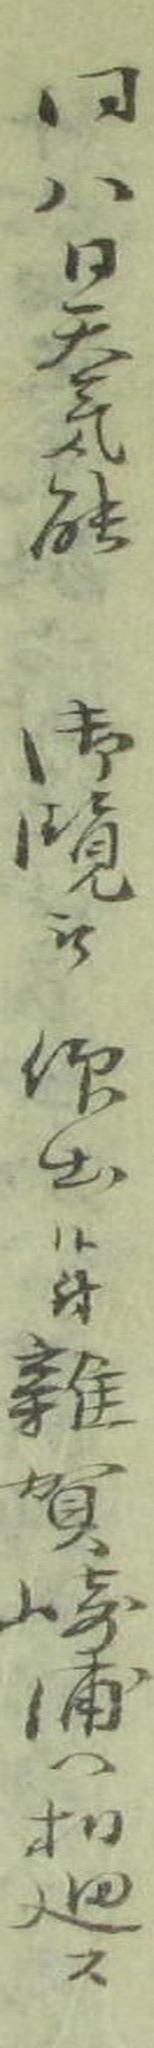同八日天気能御覧被仰出候付雑賀崎浦へ相廻ス
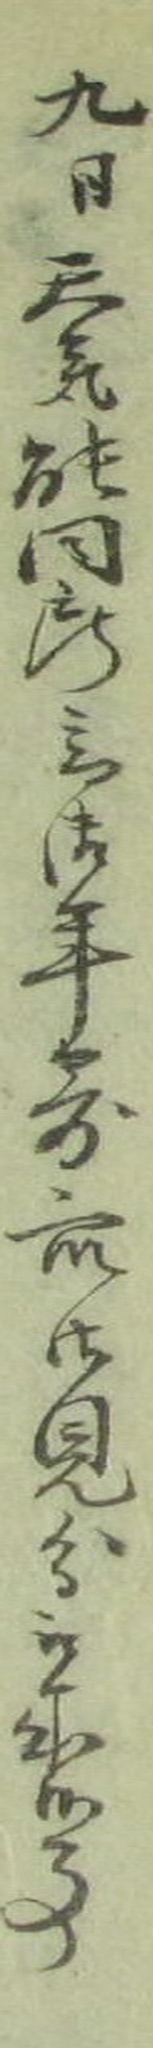九日天気能同所に而御年寄衆御見分被成候事
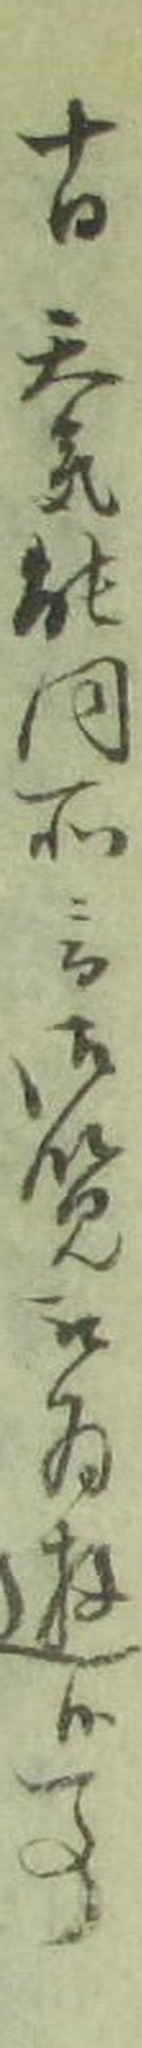十日天気能同所に而御覧被為遊候事
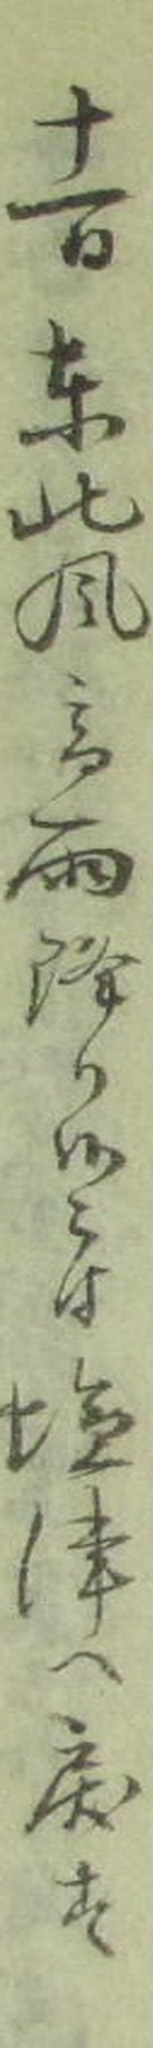十一日東北風に而雨降り候に付塩津へ戻す
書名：紀州九木浦庄屋記録 四
